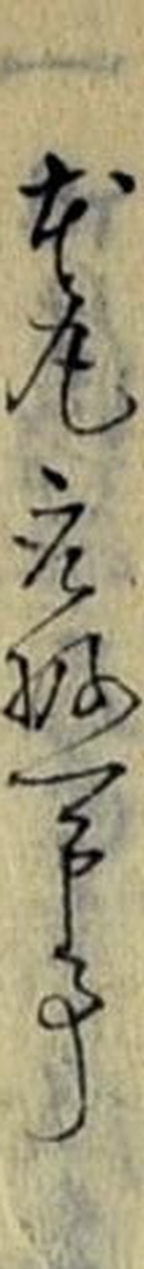本丸取扱可申事
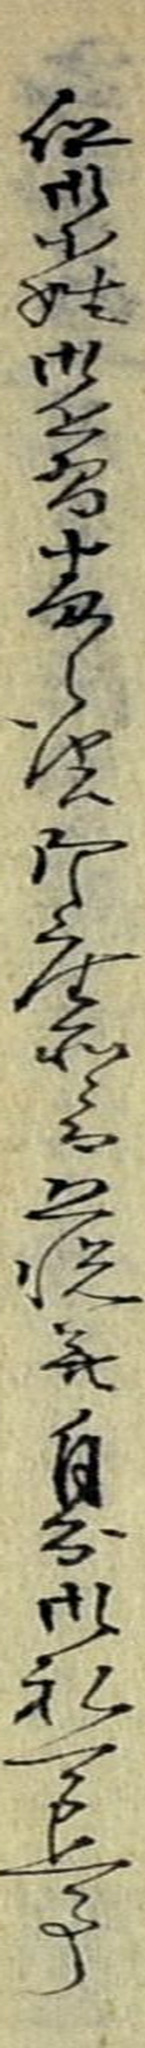但御小姓御近習番之儀は御座所に而恐悦并自分御礼可申上事
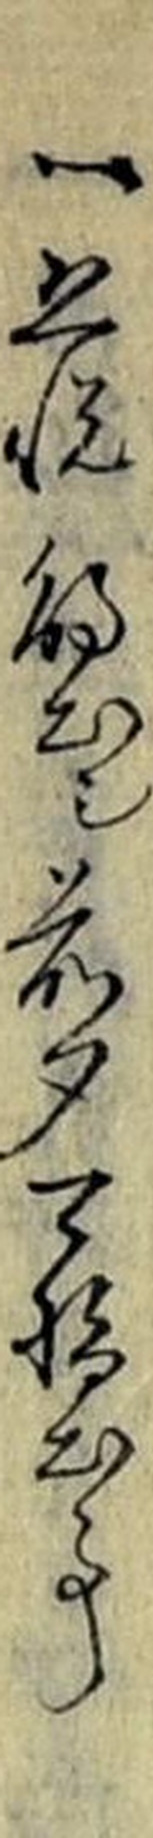一恐悦触出し前夕可指出事
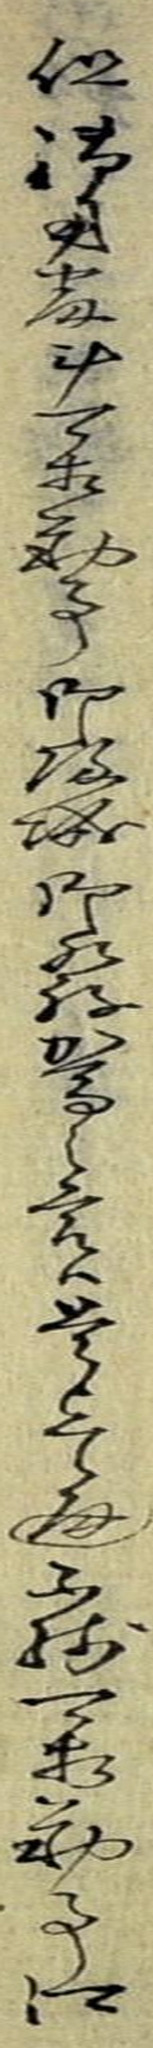但御用番斗可相勤事御帰城御發駕之節は是迄之通不残可相勤事江
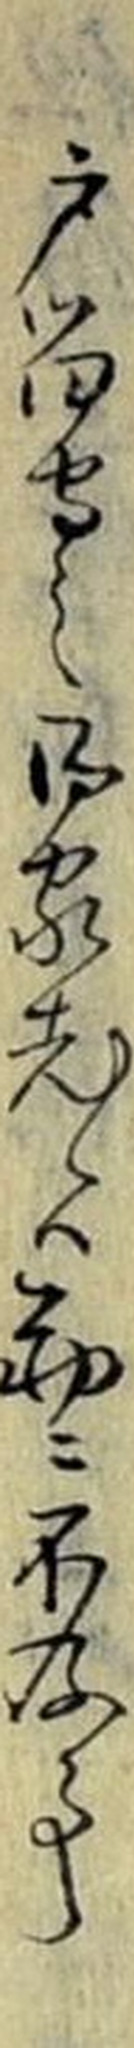戸留守之御家老ヘは勤に不及事
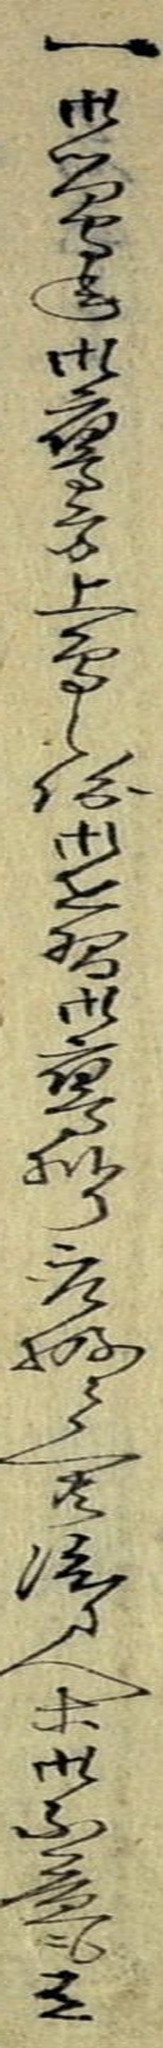一御留守年御鷹方上鳥之儀御近習御鷹掛り取扱候へ共渡り人等御不益も有
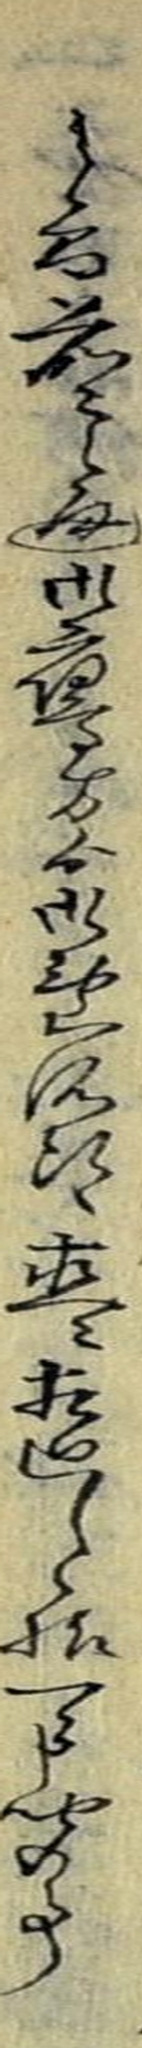之候間前々之通御鷹方ゟ御台所頭へ直々相廻し候様可申聞事
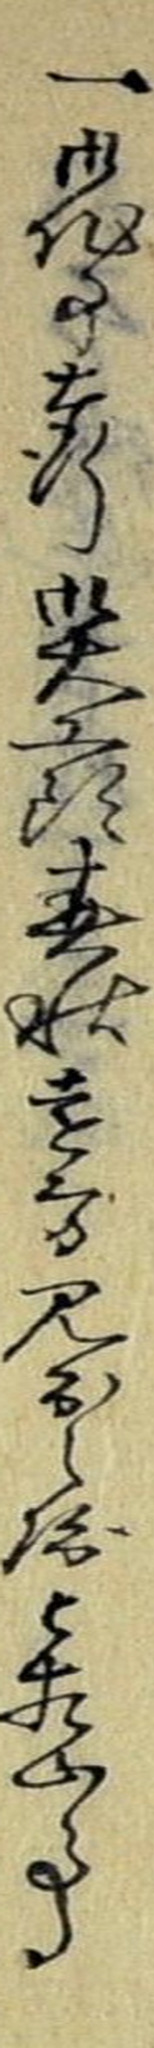一御作事奉行御大工頭春秋遠方見分之儀被相止候事
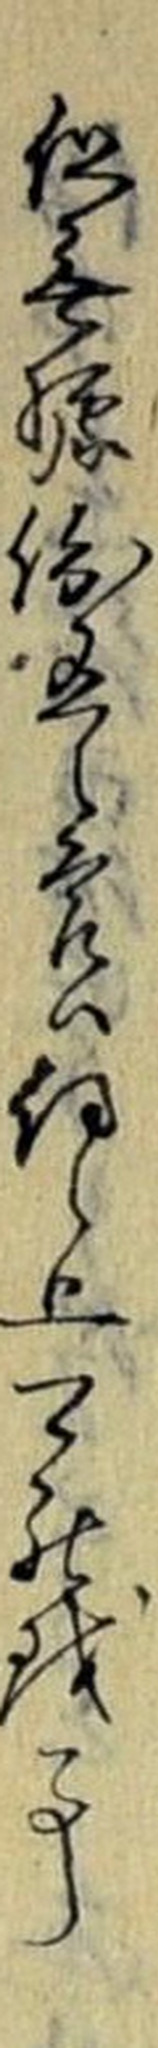但無拠儀有之節は伺之上可罷越事
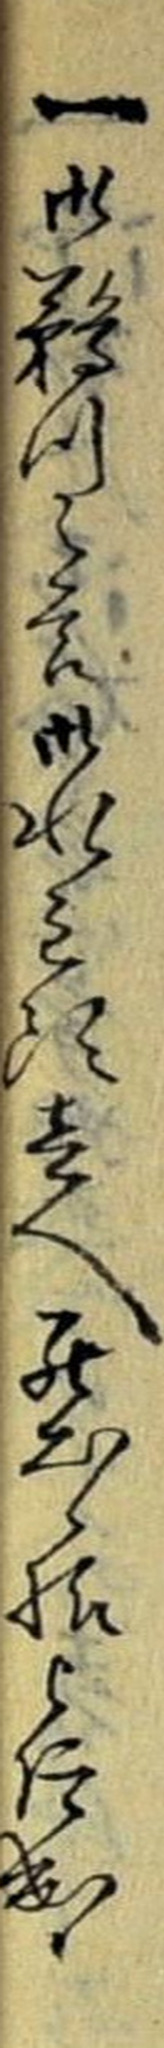一御鵜川之節御水主頭壱人罷出候様被仰遣候
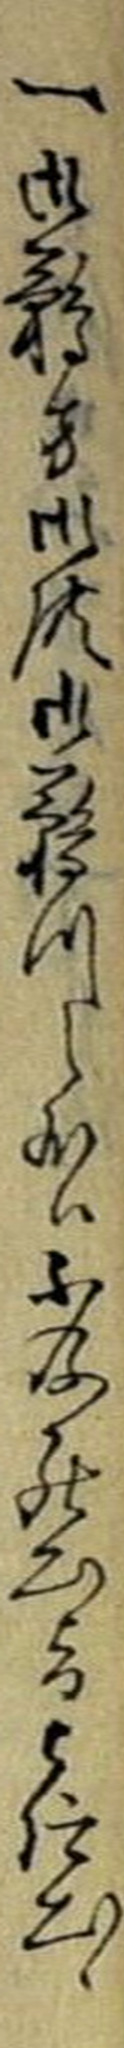一御鵜方御供御鵜川之外は不及罷出旨被仰出候
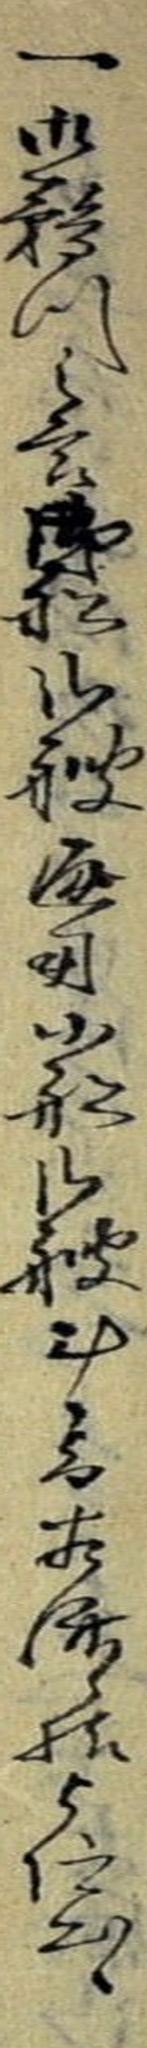一御鵜川之節御船弐艘通用小船弐艘斗に而相済候様被仰出候
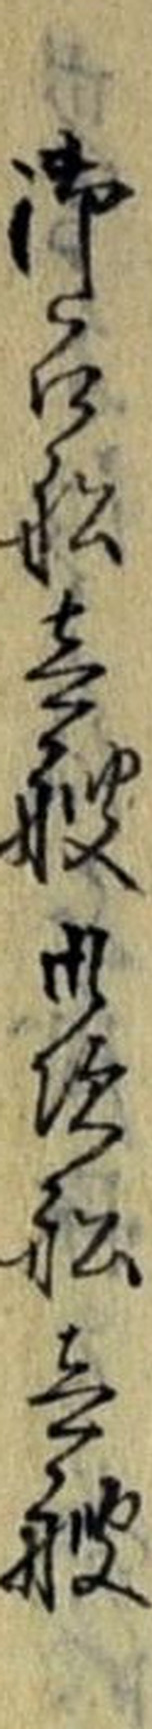御召船壱艘御次船壱艘
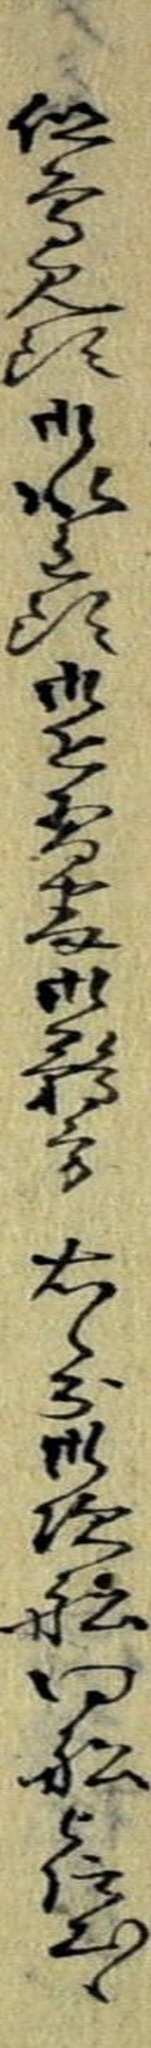但鳥見頭御水主頭御近習番御鵜方右之分御次船同船被仰出候
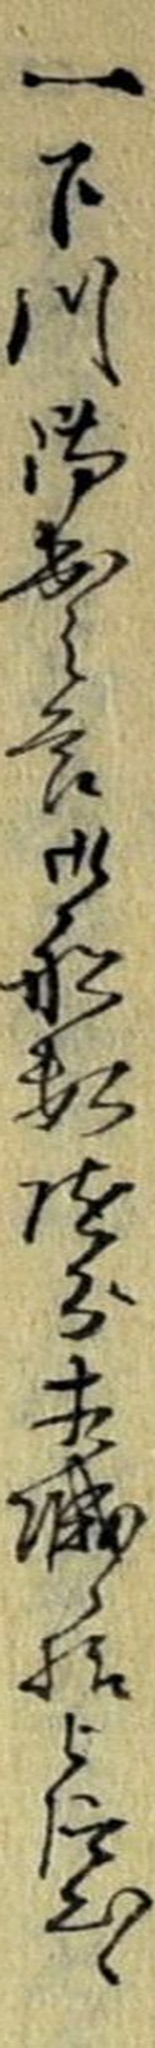一下川御出之節御船数随分相減候様被仰出候
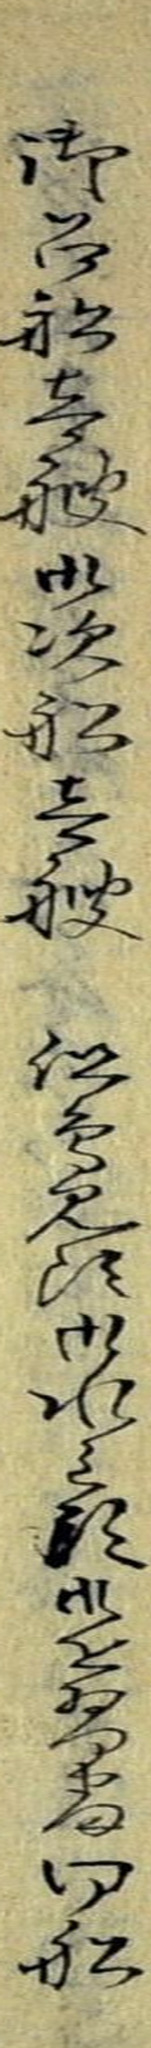御召船壱艘御次船壱艘但鳥見頭御水主頭御近習番同船
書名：命令之部 四
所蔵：福井県文書館 Fukui Prefectural Archives
